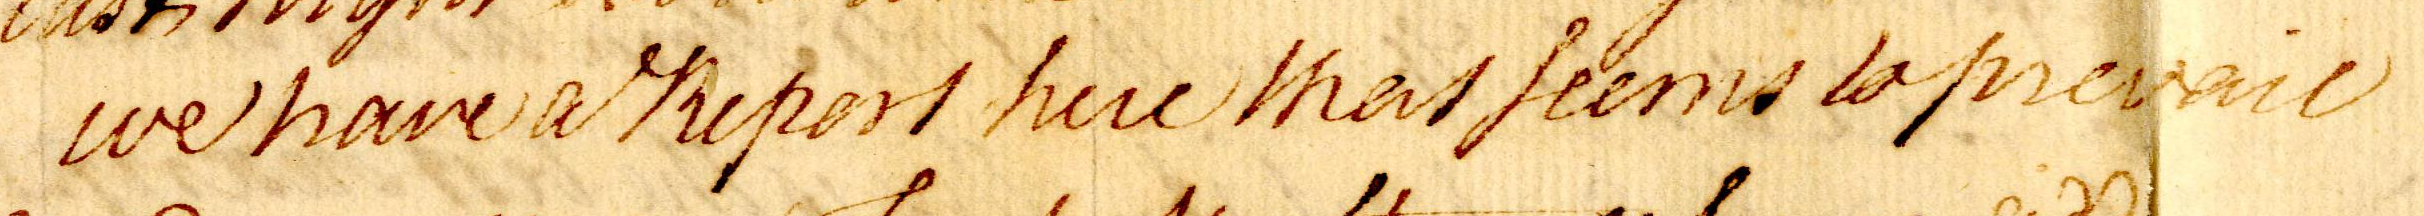we have a Report here that seems to prevail
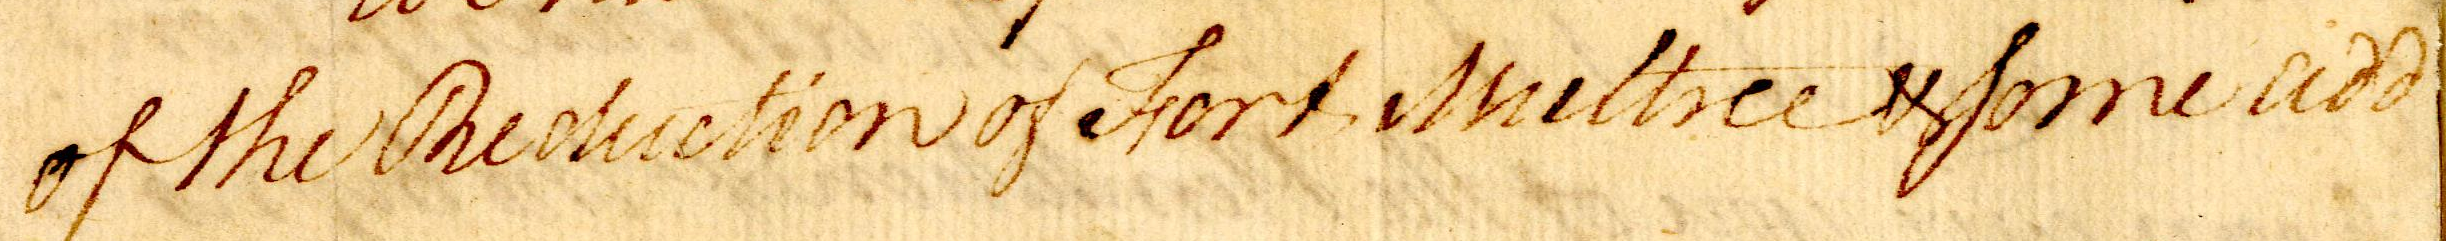of the Reduction of Fort Multree & some add
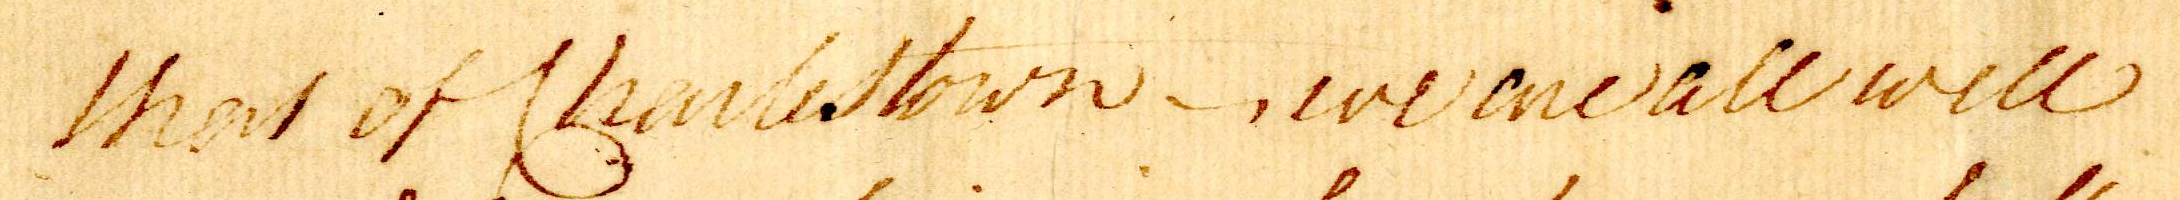that of Charestown. we are all well
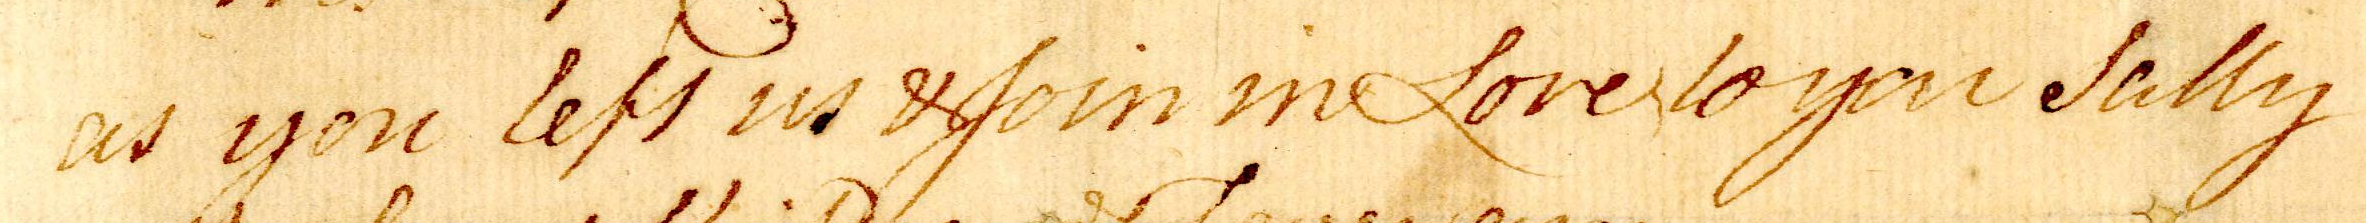as you left us & join in love to you Sally
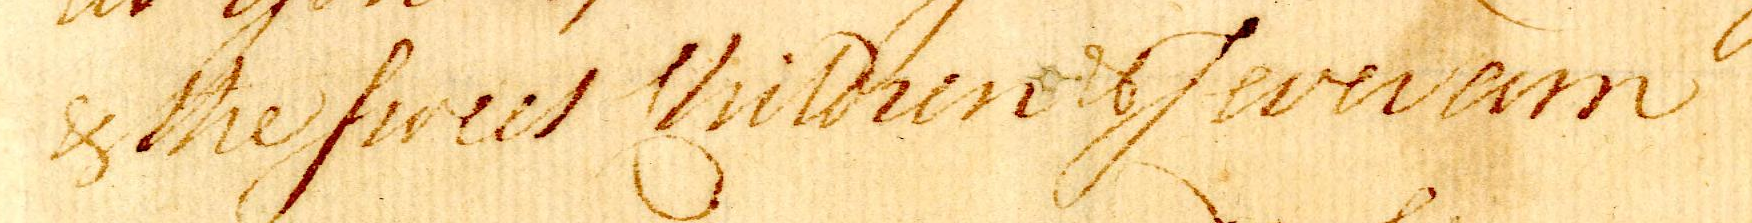& the sweet Children & I ever am
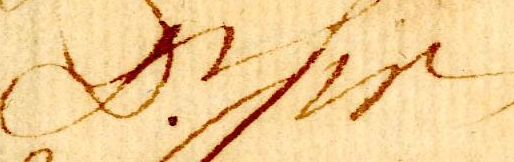D^r Sir
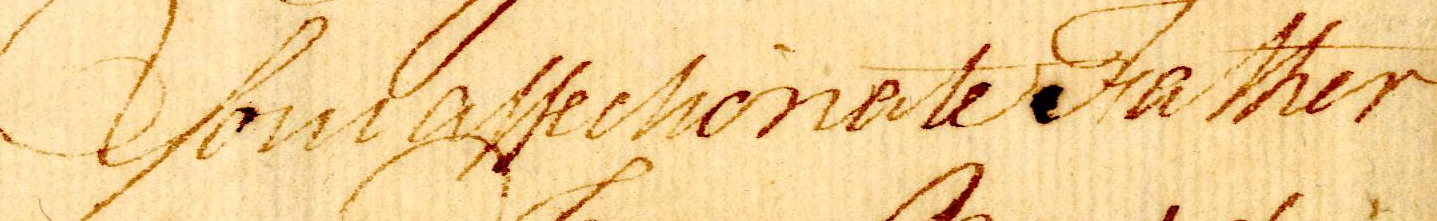Your affectionate Father
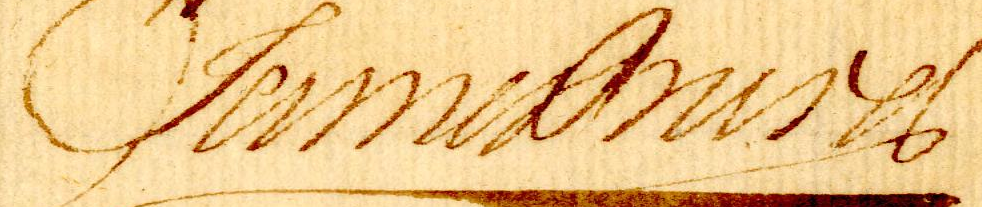James Burd
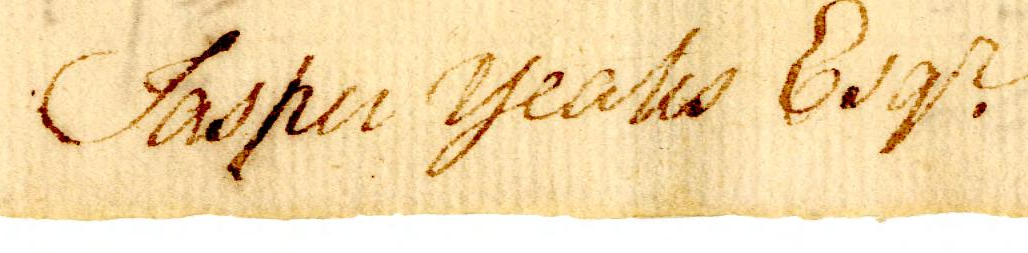Jasper Yeates Esq^r:
